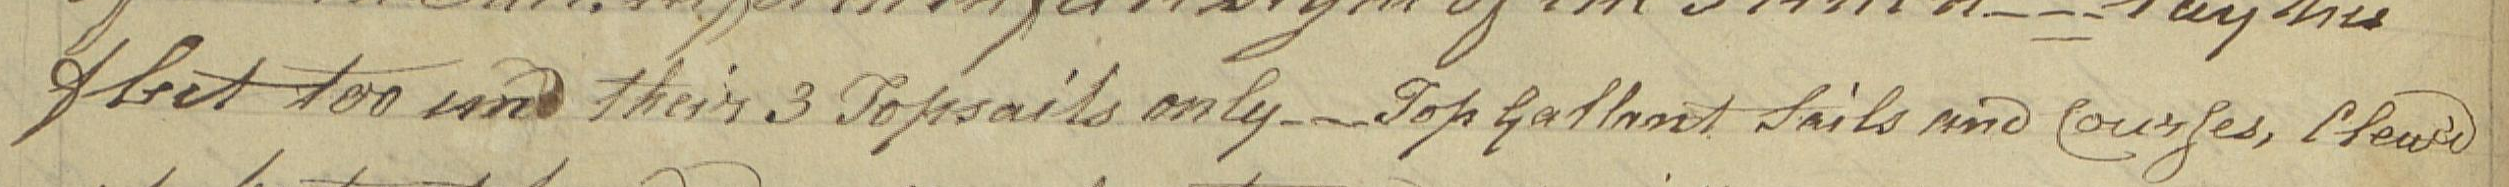I bet too end their 3 Topsails only, Top gallant sails and courses, clew'd
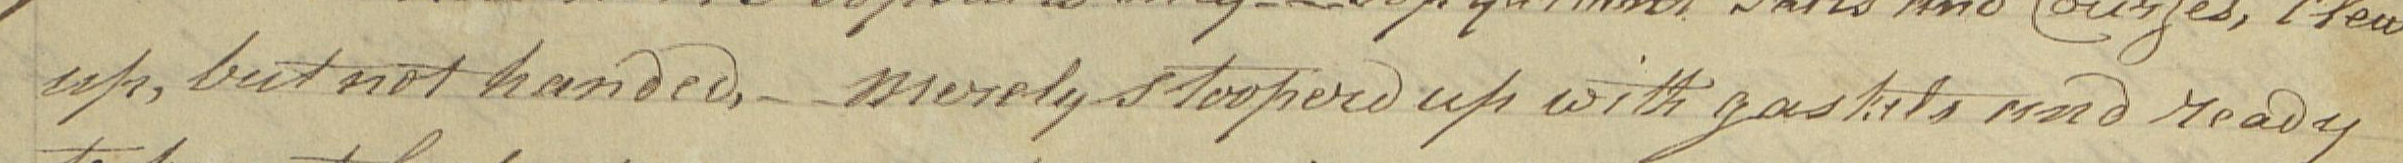up, but not handed, merely stooperd up with gaskets and ready
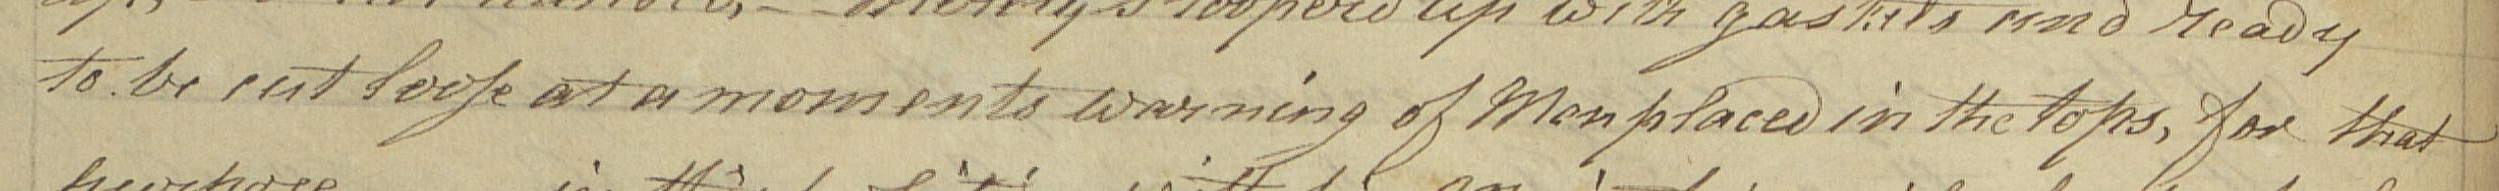to be cut loose at a moments warning of Men placed in the tops, for that
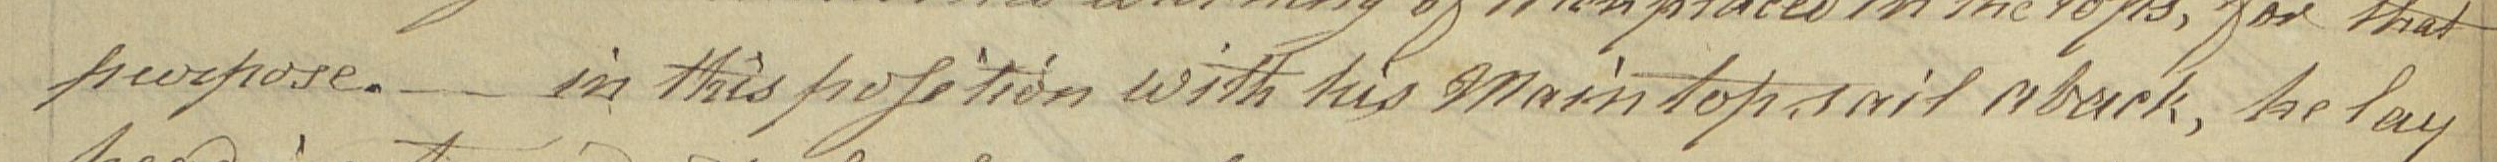purpose. in this position with his Main topsail aback, he lay
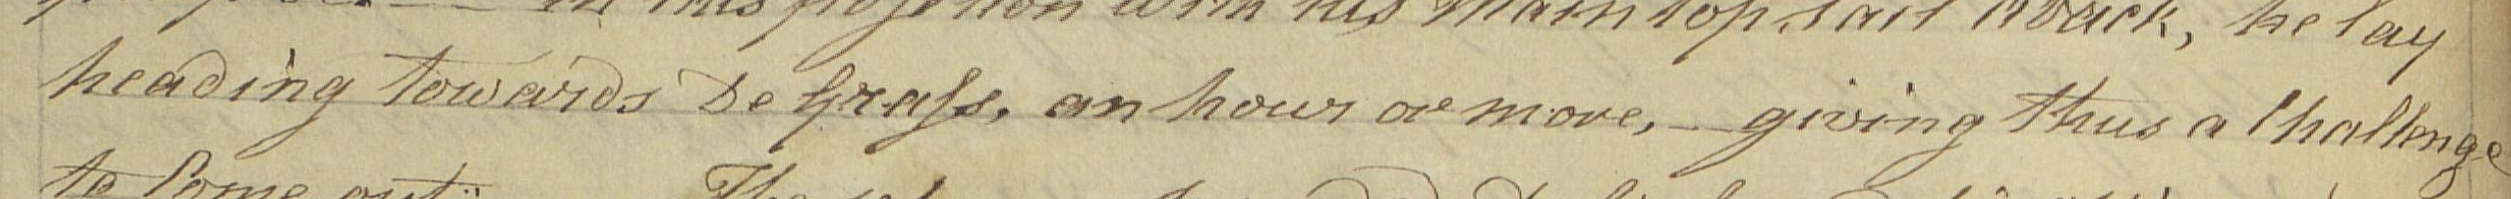heading towards De Grass, an hour or more, giving thus a Challenge
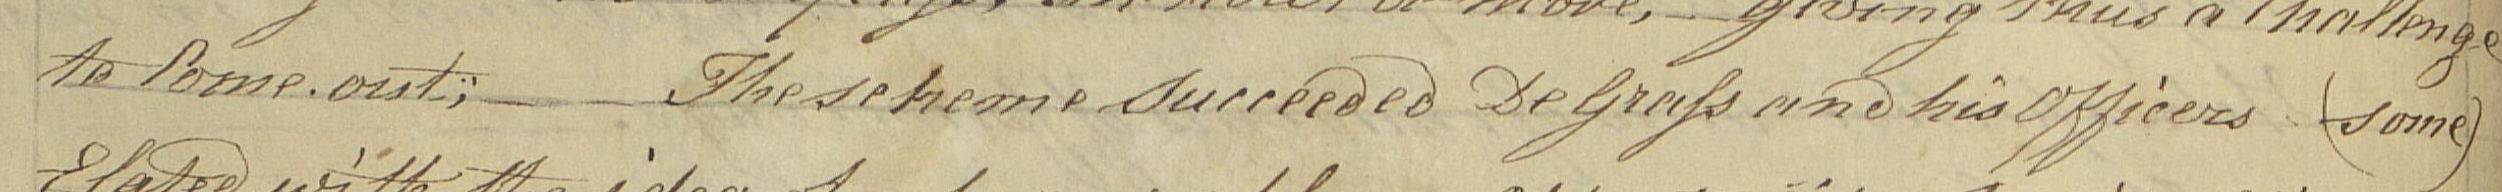to come out; These heme succeed De Grass nad his officers (some)
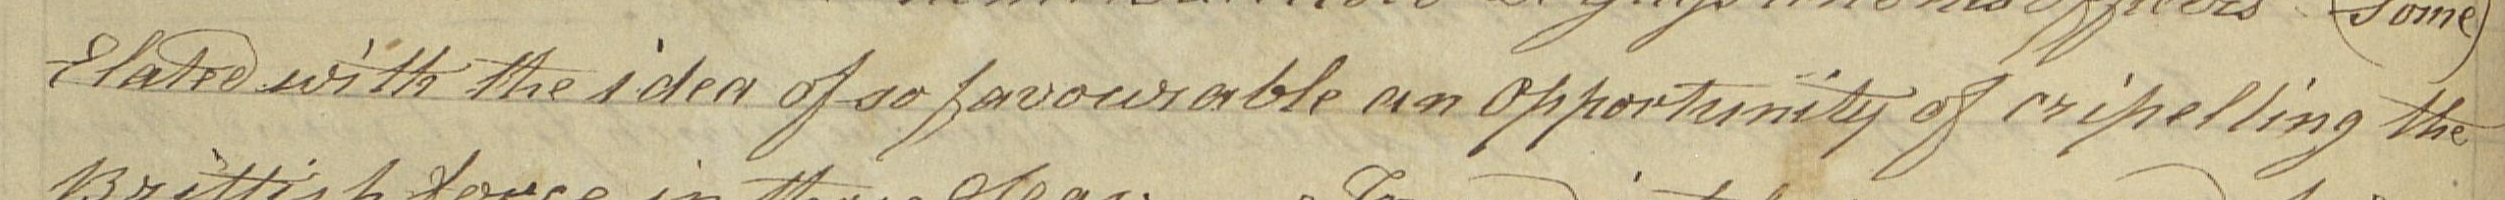Elated with the idea of so favourable an Opportunity of Cripelling the
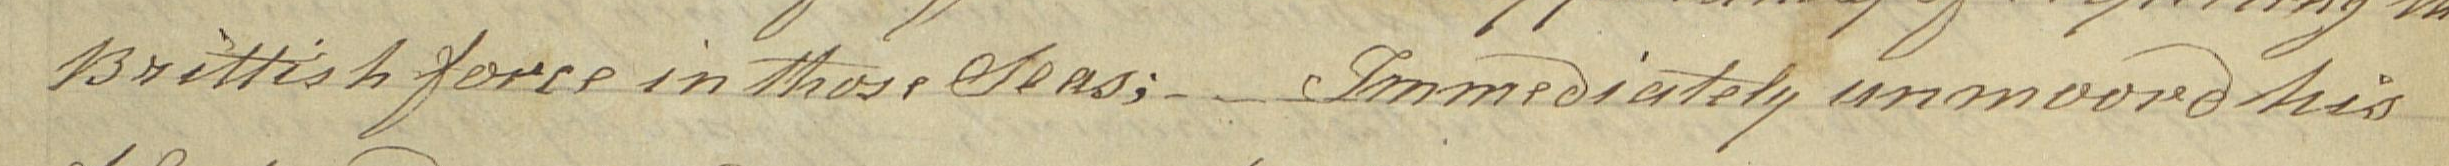Brittish force in those Seas; Immediately unmoord his
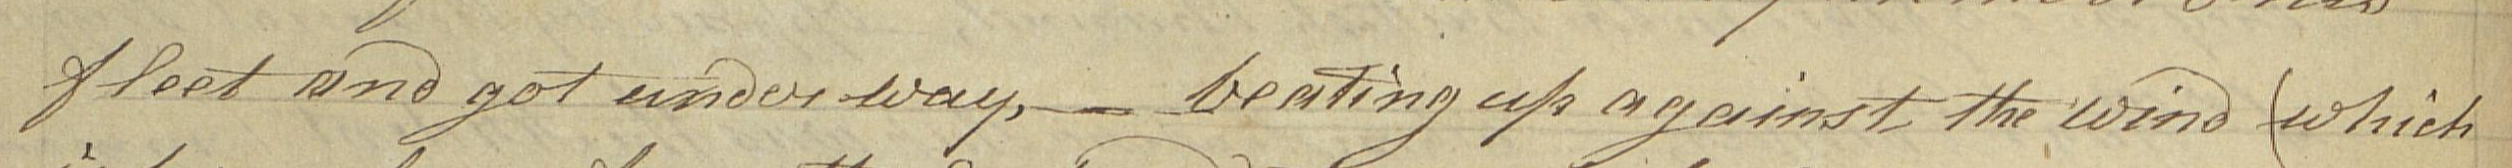fleet and got under way, beating up against the wind (which
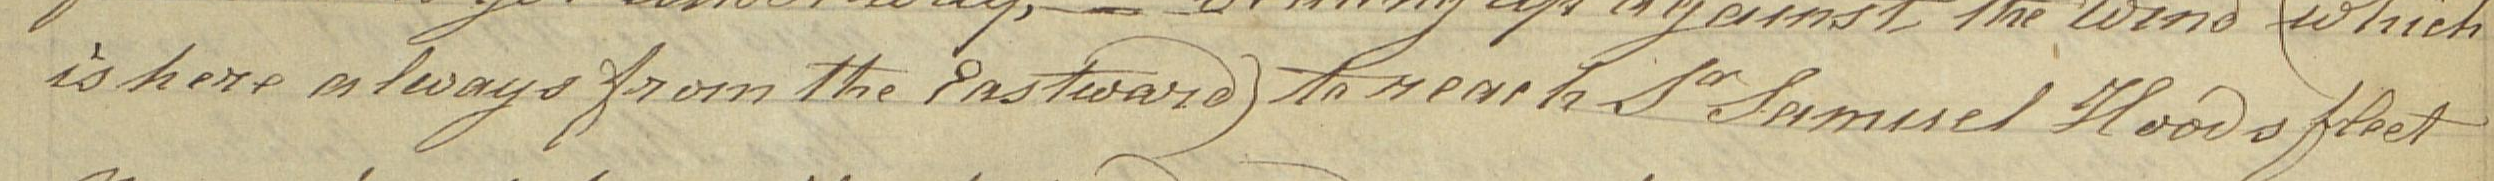is here always from the Eastward) to reach S^r Samuel Hoods fleet
